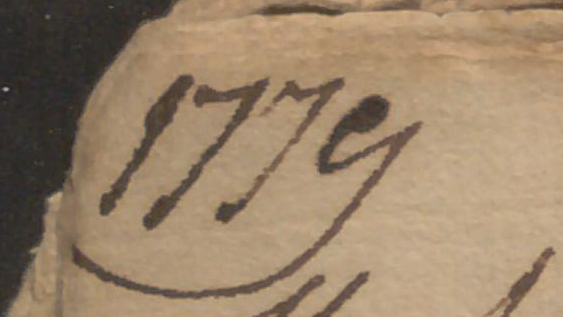1779
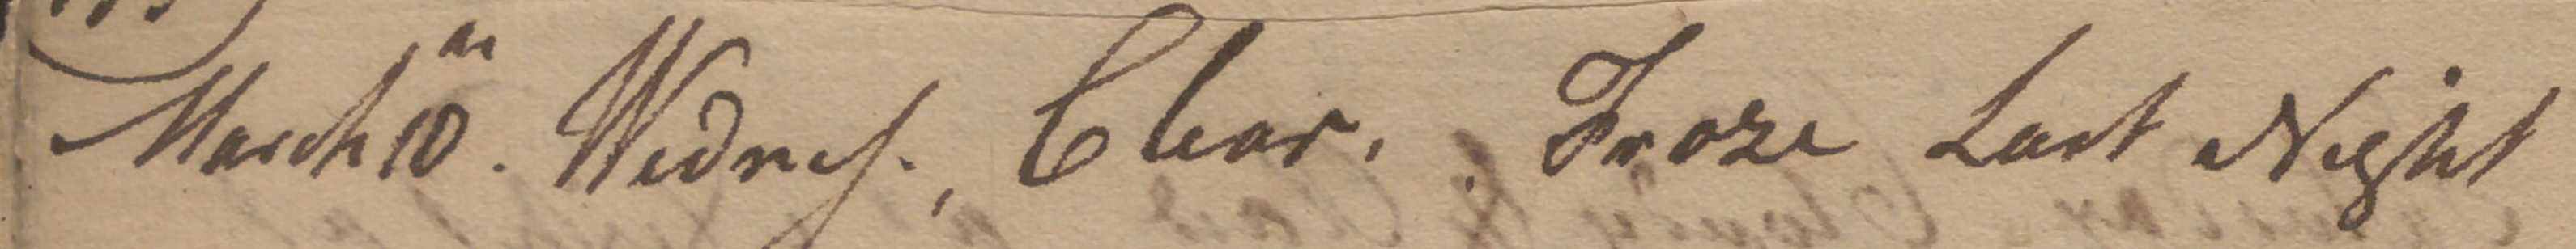March 10^h. Wednes. Clear. Froze Last Night
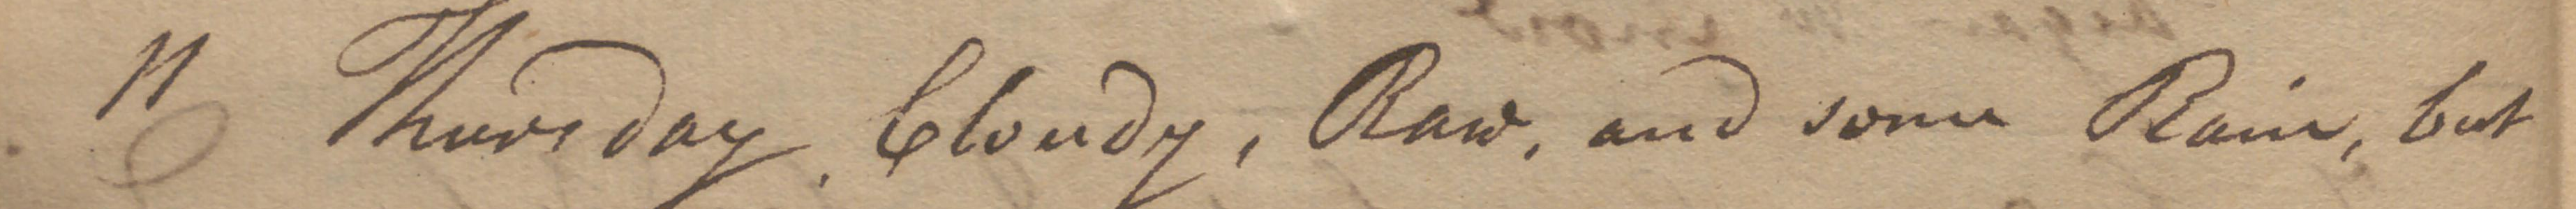11 Thursday, Cloudy, Raw, and some Rain, but
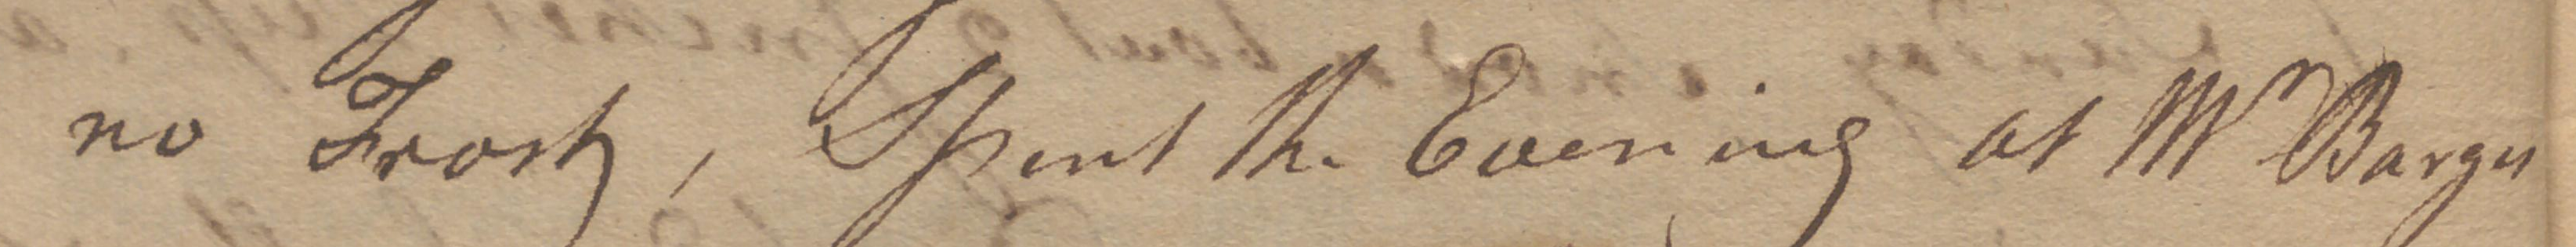no Frost, spent the Evening at M^r Barges
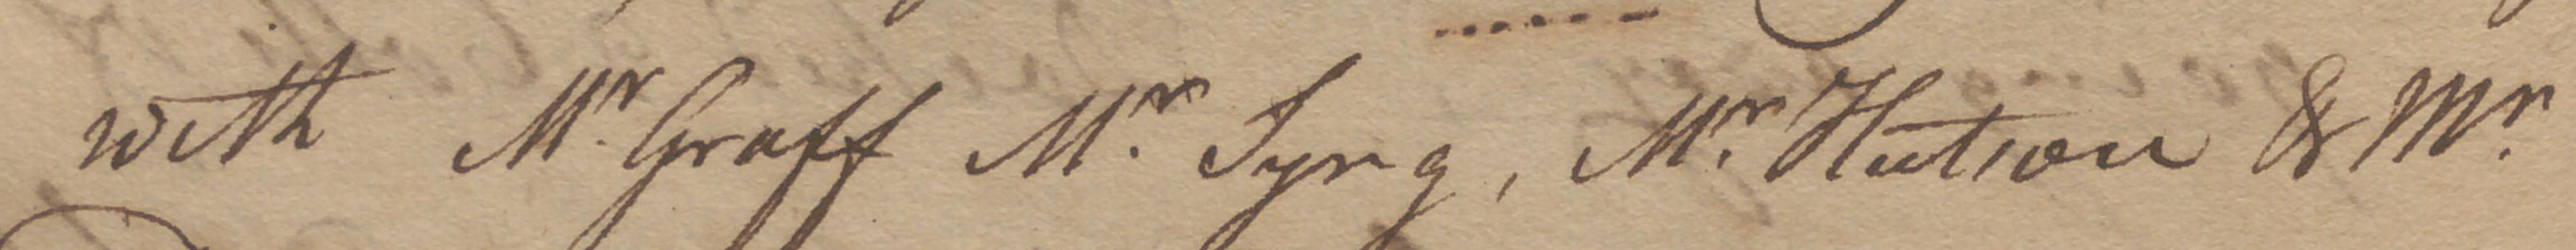with M^r. Graff M^r. Syng, M^r. Hutson & M^r.
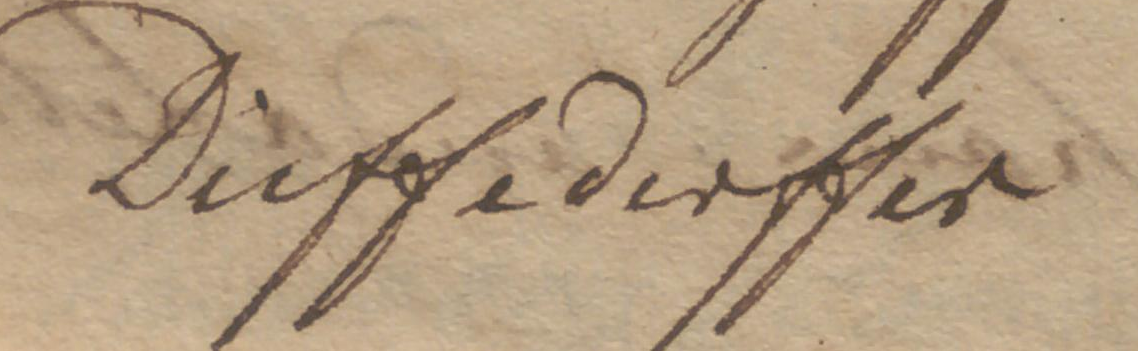Diffederffer
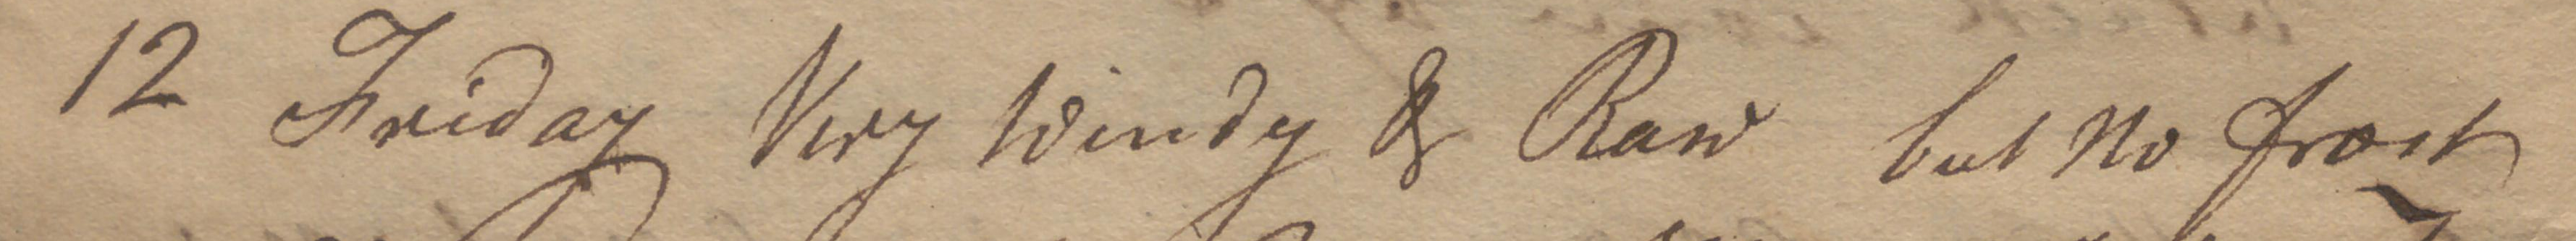12 Friday Very Windy & Raw, but no frost
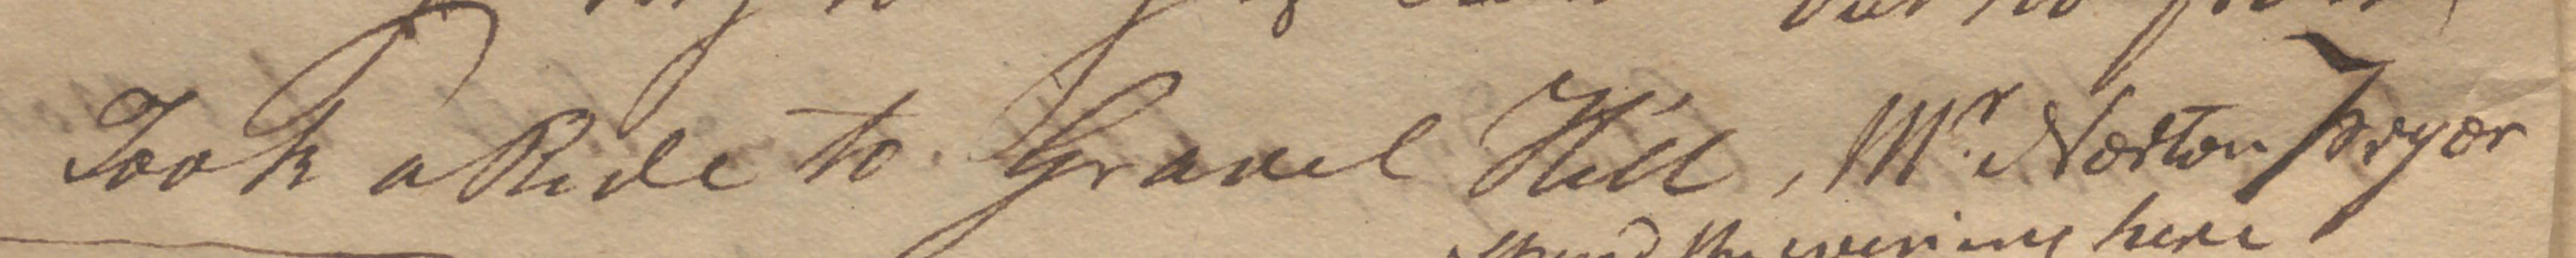Took a Ride to Gravel Hill, M^r. Norton pryor
